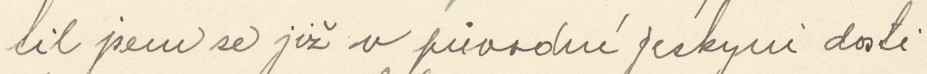til jsem se již v původní jeskyni dosti
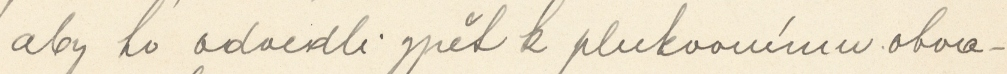aby ho odvedli zpět k plukovnímu obva-
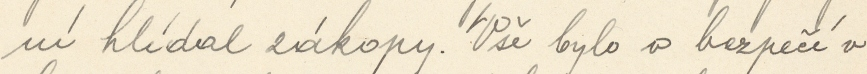ní hlídal zákopy. Vše bylo v bezpečí v
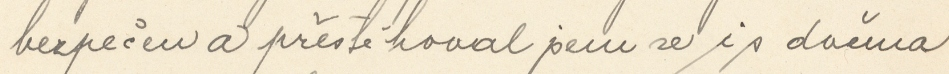bezpečen a přestěhoval jsem se i s dvěma
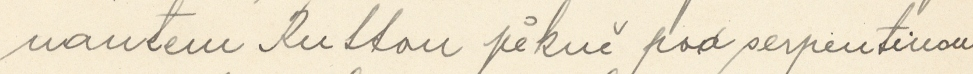nantem Ruttou pěkně pod serpentinou
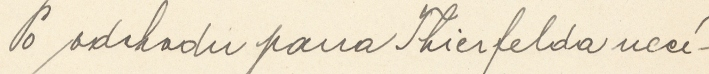Po odchodu pana Thierfelda necí-
